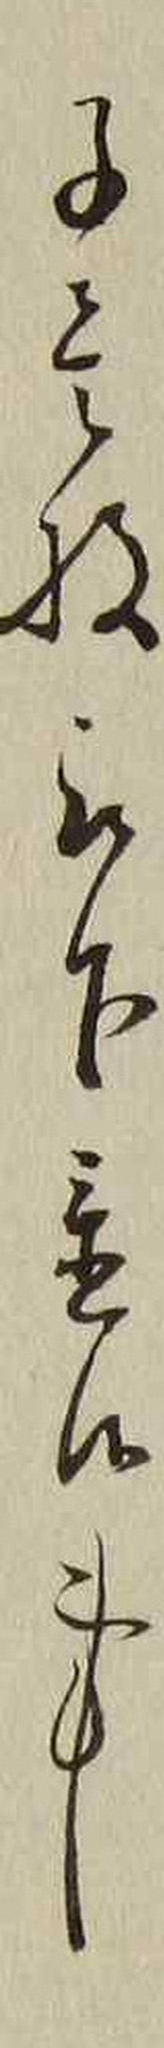子壱枚被下置候事
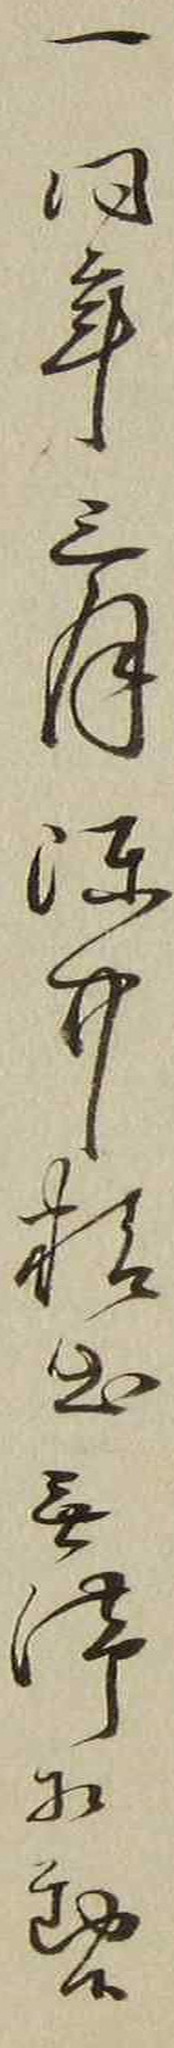一同年三月陣中精出無滞相勤候
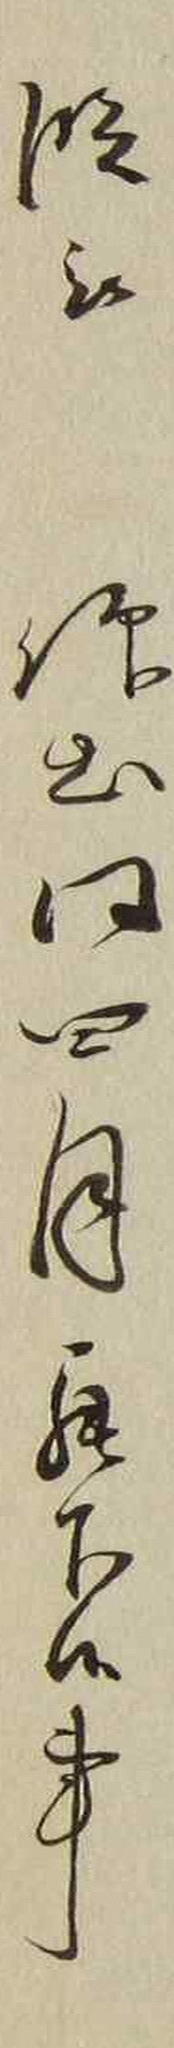段被仰出同四月罷下候事

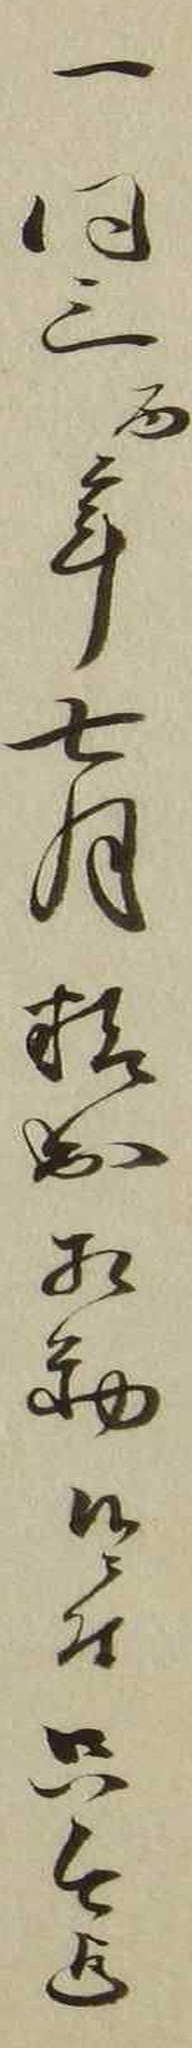一同三酉年七月精出相勤候ニ付只今迄
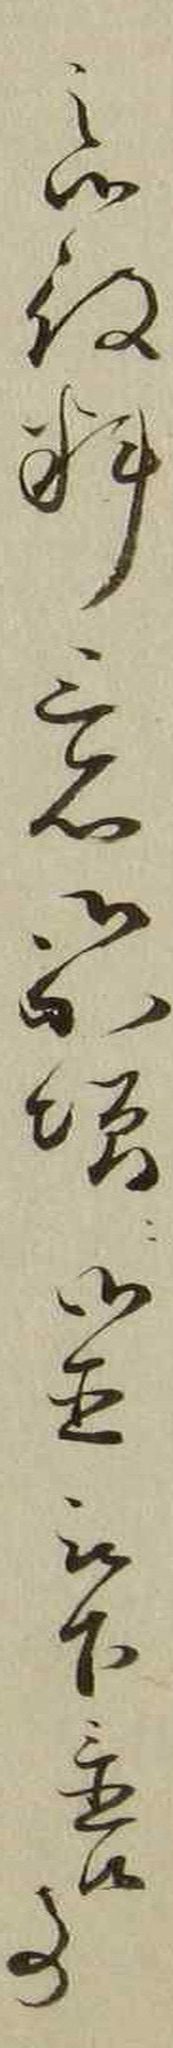之御役料三石御加増御直被下置候事
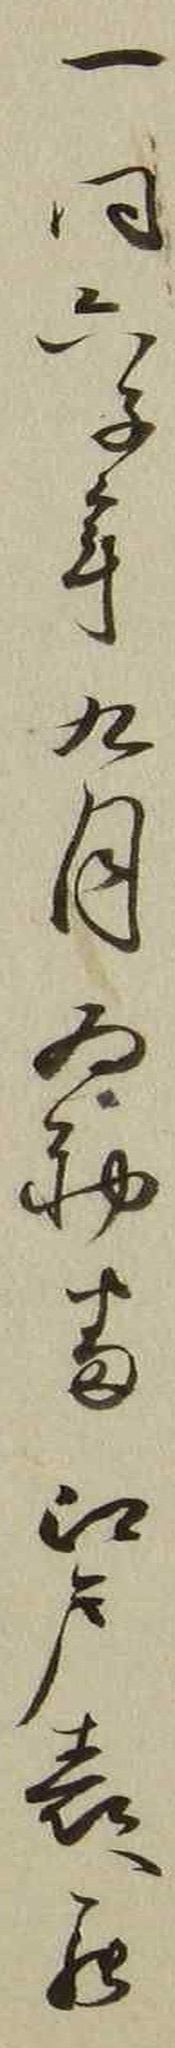一同六子年九月為勤番江戸表へ罷
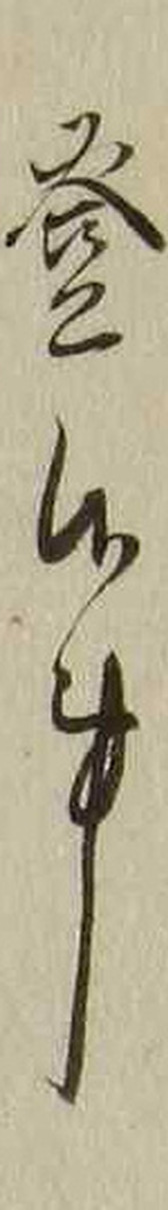登候事
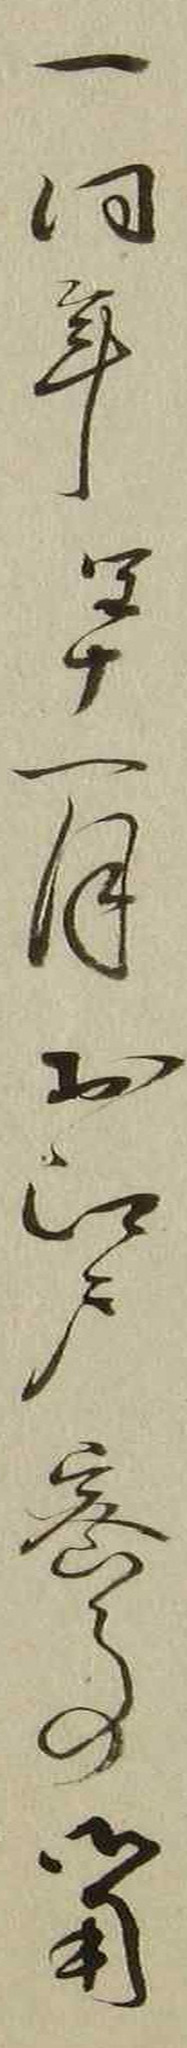一同年閏十一月於江戸密事御用
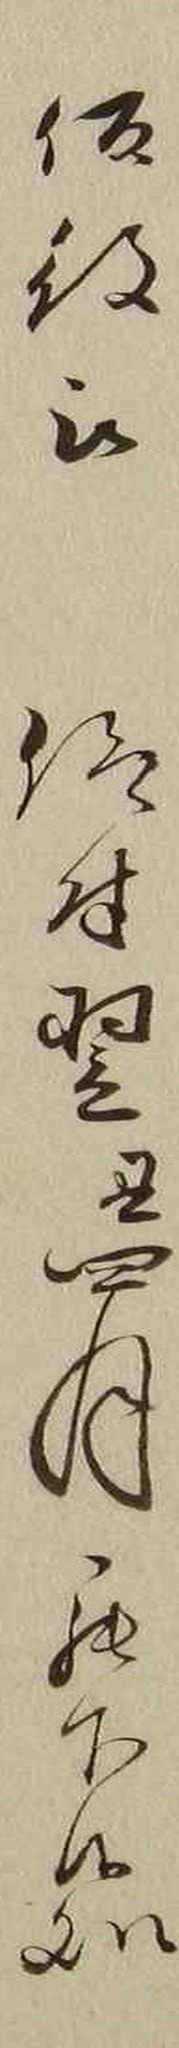仮役被仰付翌丑四月罷下候処
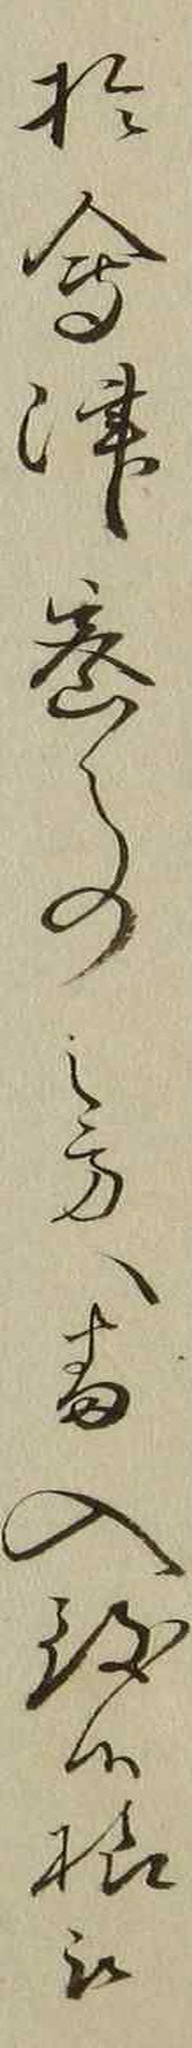於会津密事之方へ番入致候様被
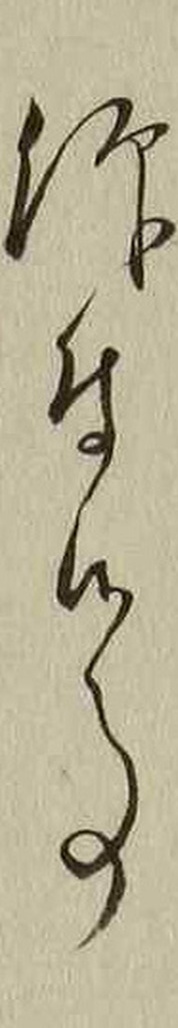仰付候事
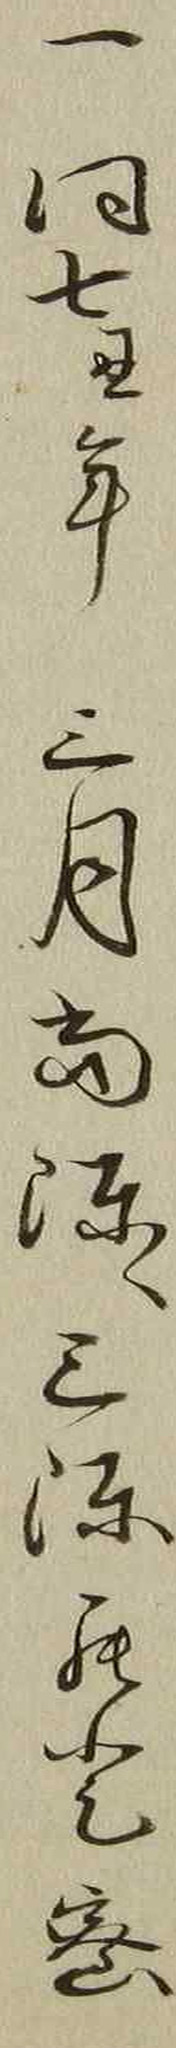一同七丑年三月当陣へ三陣罷登密
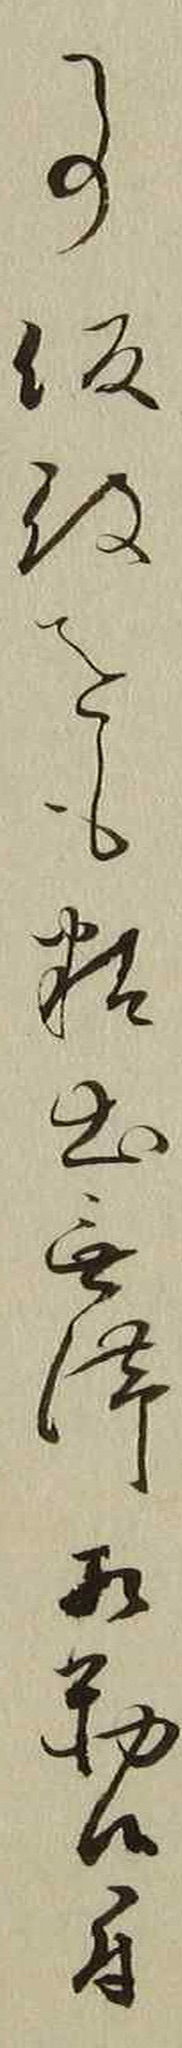事仮役をも精出無滞相勤候ニ付
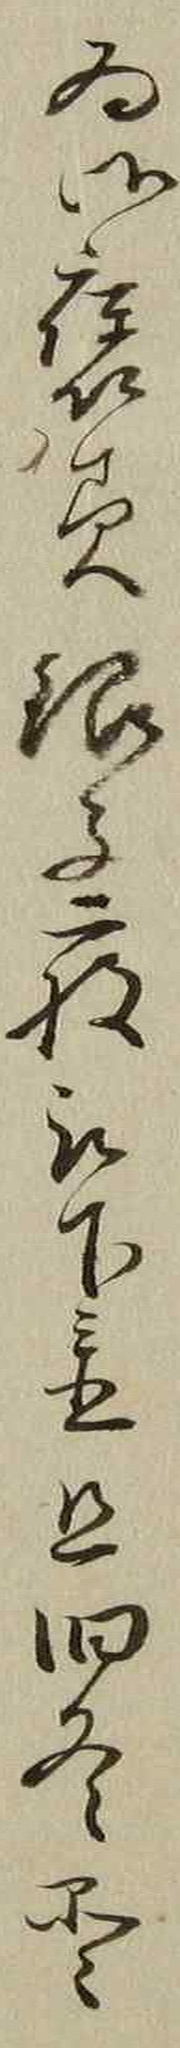為御褒美銀子二枚被下置且旧冬品々
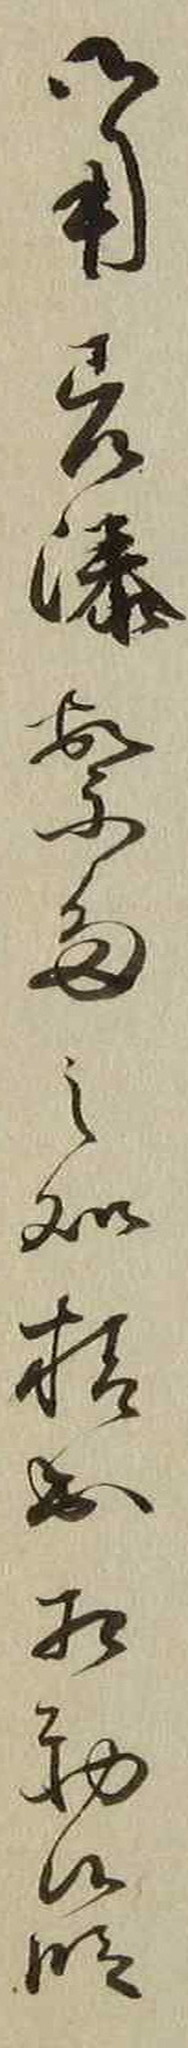御用差添繁多之処精出相勤候段
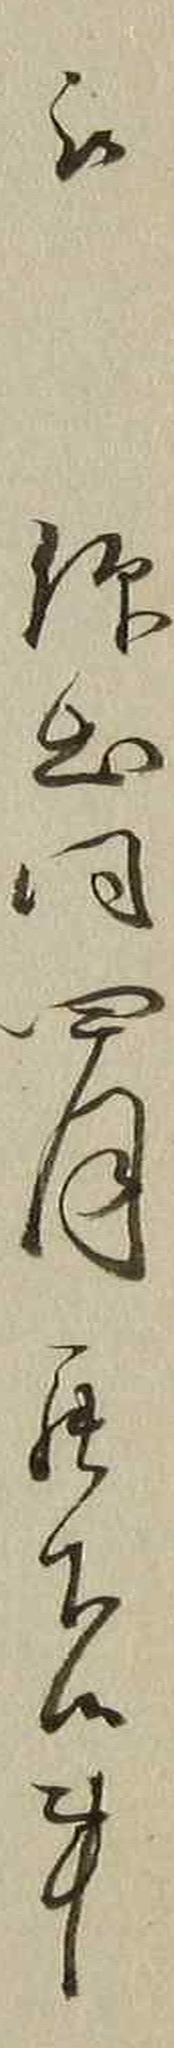被仰出同四月罷下候事
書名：諸士系譜　巻之52　に之部3
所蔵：会津若松市立会津図書館
